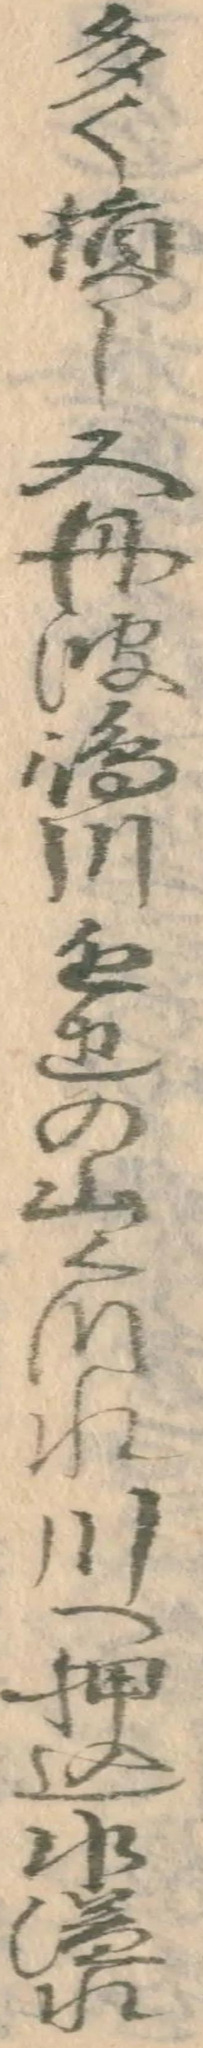多く損し又丹波嶋川近辺山くつれ川へ押込水溢れ
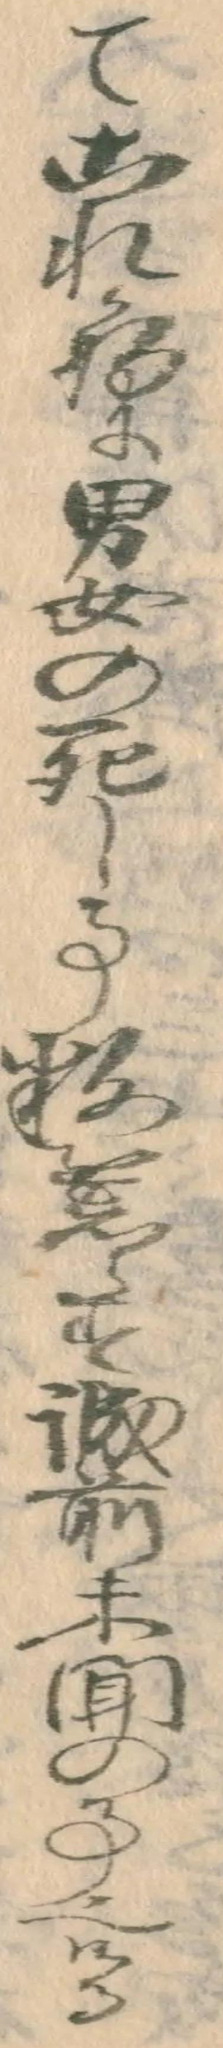てこれか為に男女の死し事数をしらす誠前未聞の事也ける
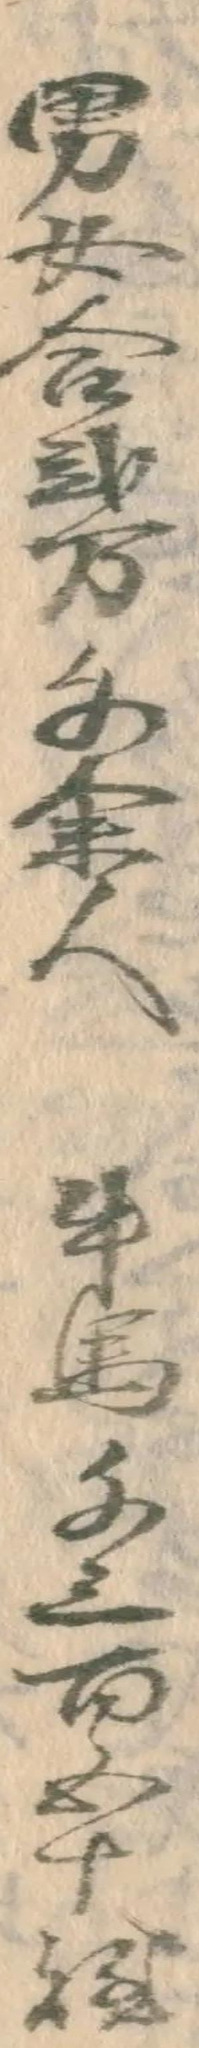男女合弐万千余人牛馬千三百五十程
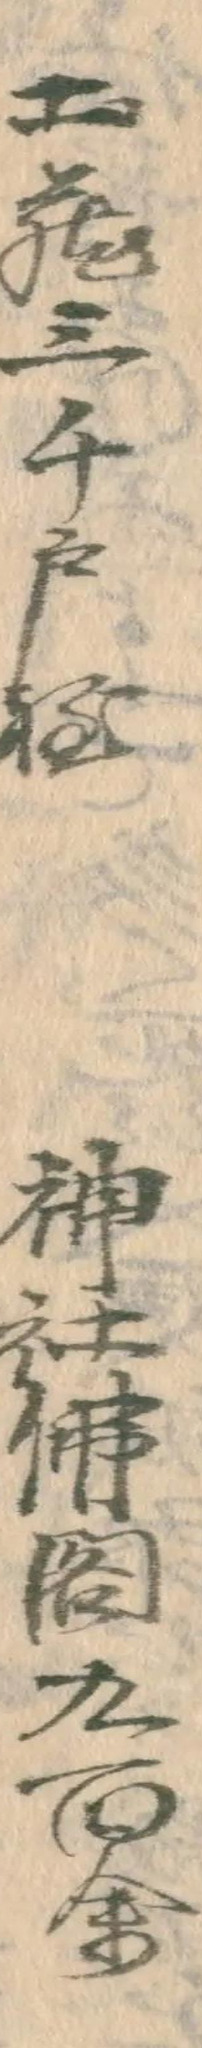土蔵三千戸程神社仏閣九百余
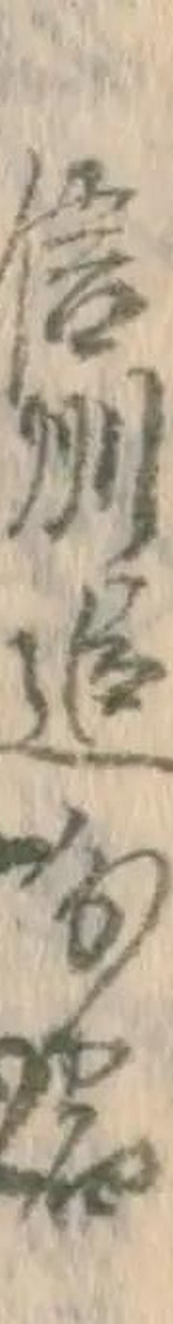信州追分宿
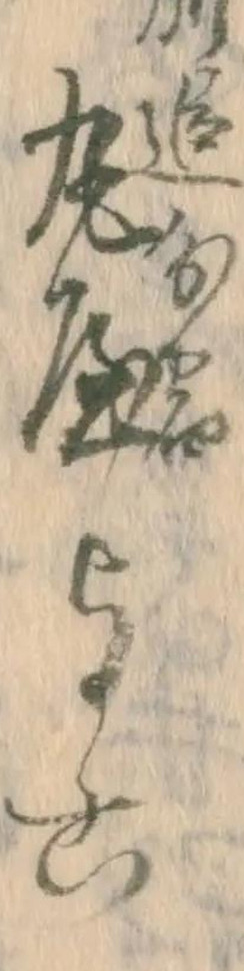丸屋与六
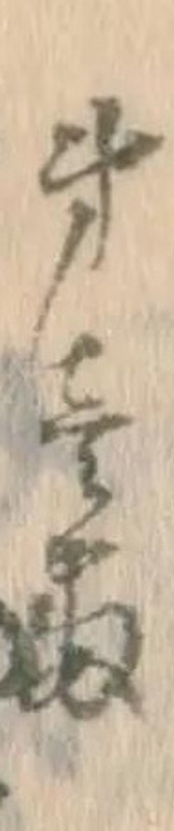第壱番
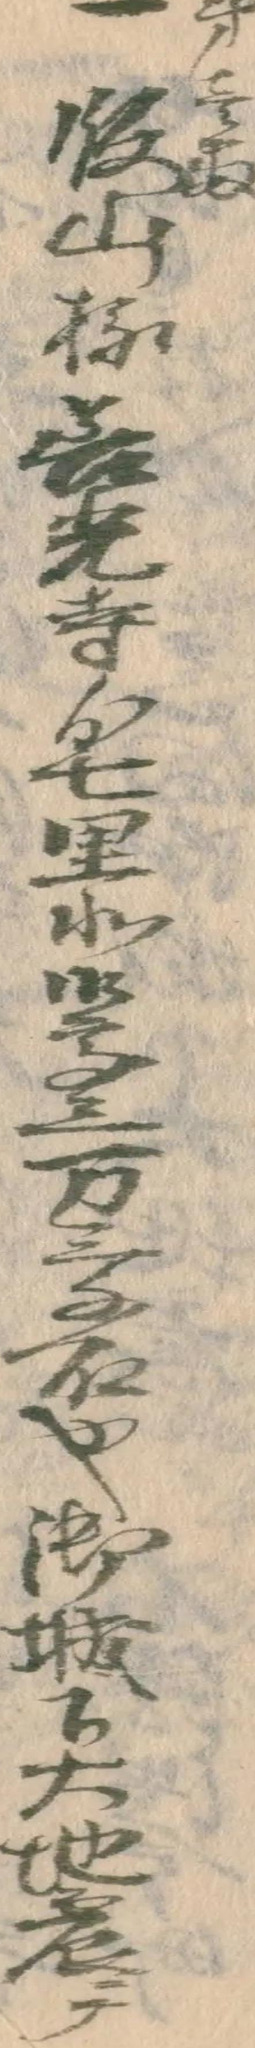一飯山様善光寺ゟ七里北御高三万三千石也御城下大地震二テ
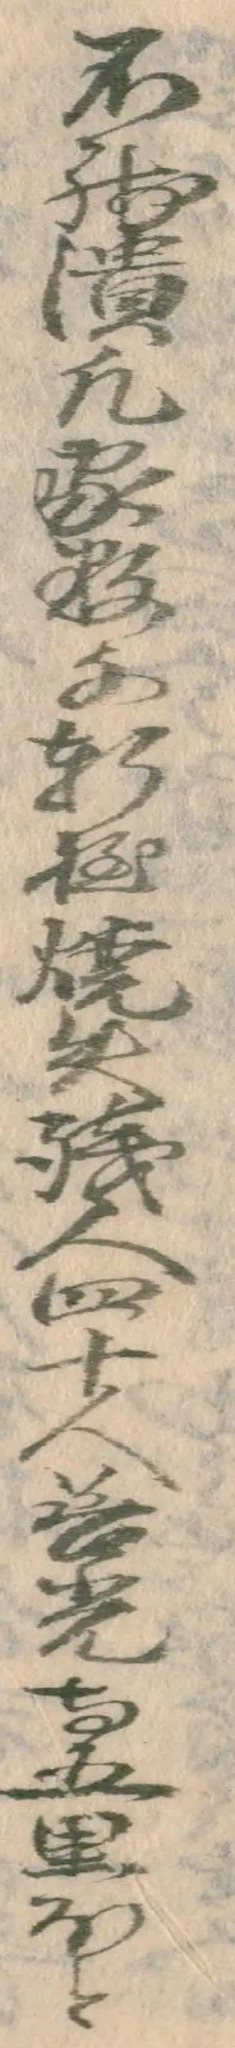不残潰凡仮家数千軒程焼失残人四十人善光寺五里ほと
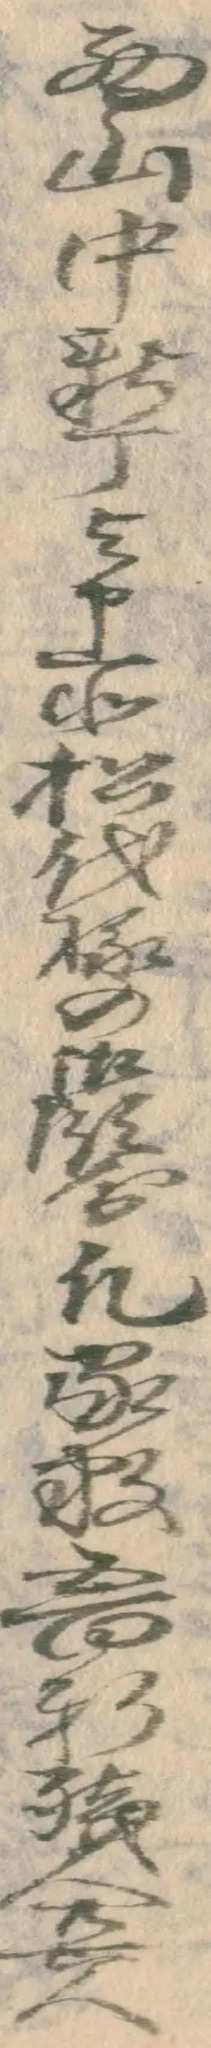西山中新丁と申所松代様の御領分凡家数五百軒残人廿五人
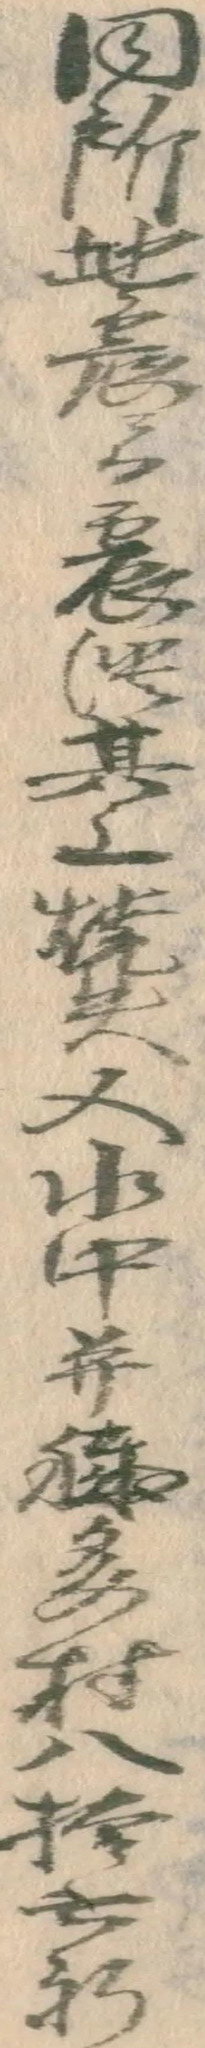同所地震二而震潰其上焼失又水中并殊多村八拾五軒
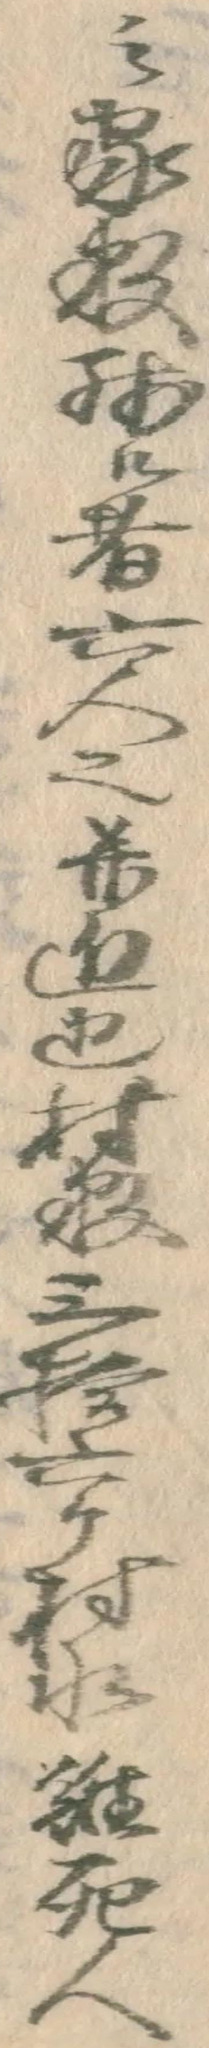之家数残ル者六人也并近辺村数三拾六ヶ村水難死人
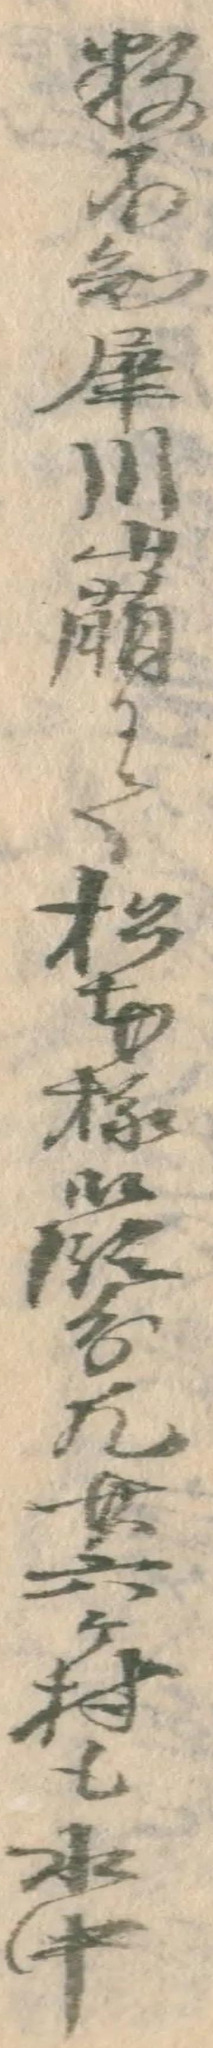数不知犀川山崩にて松本様御領分凡廿六ヶ村も水中
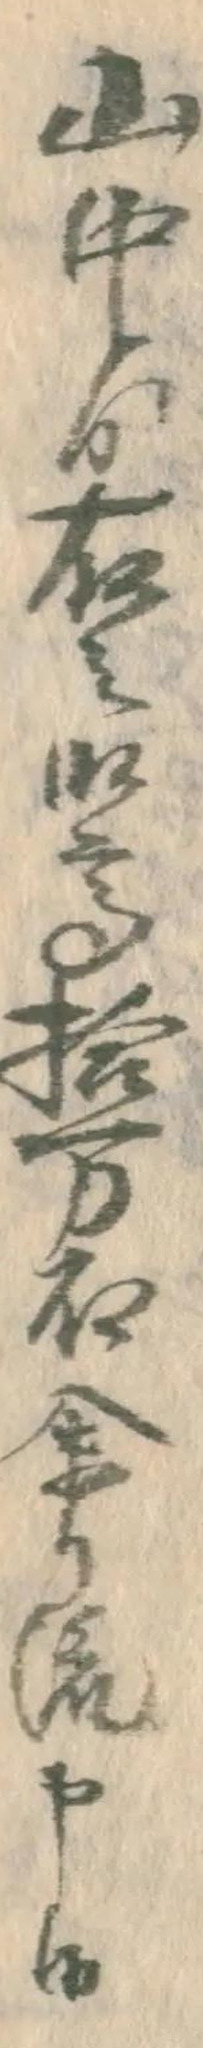山中ゟ右之御高拾万石余り流申候
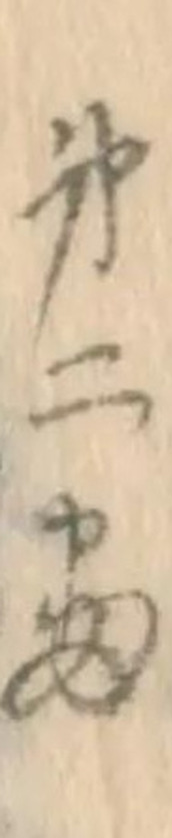第二番
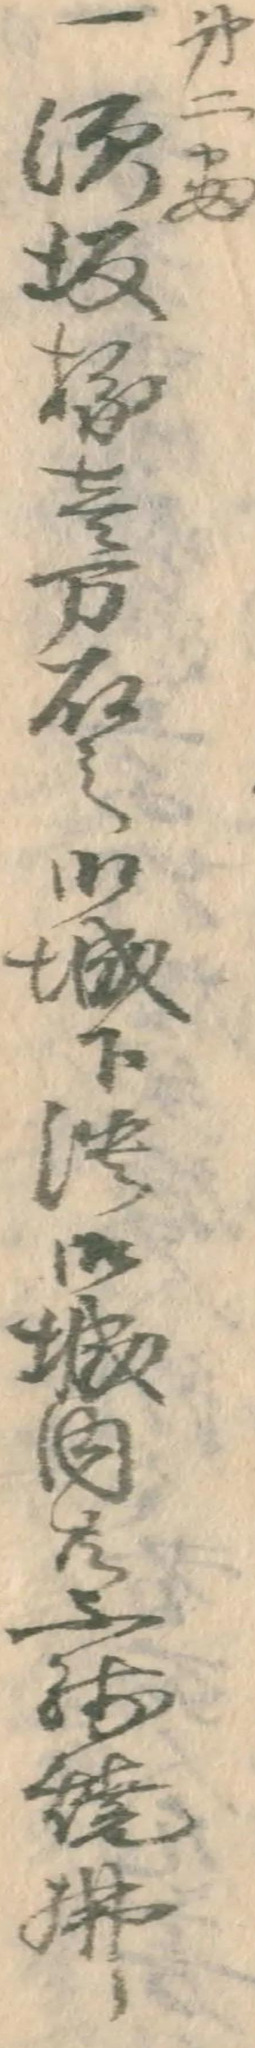一須坂様壱万石之御城下潰御城内共不残焼払
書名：信州大地震之記
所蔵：国立国会図書館 National Diet Library, JAPAN
